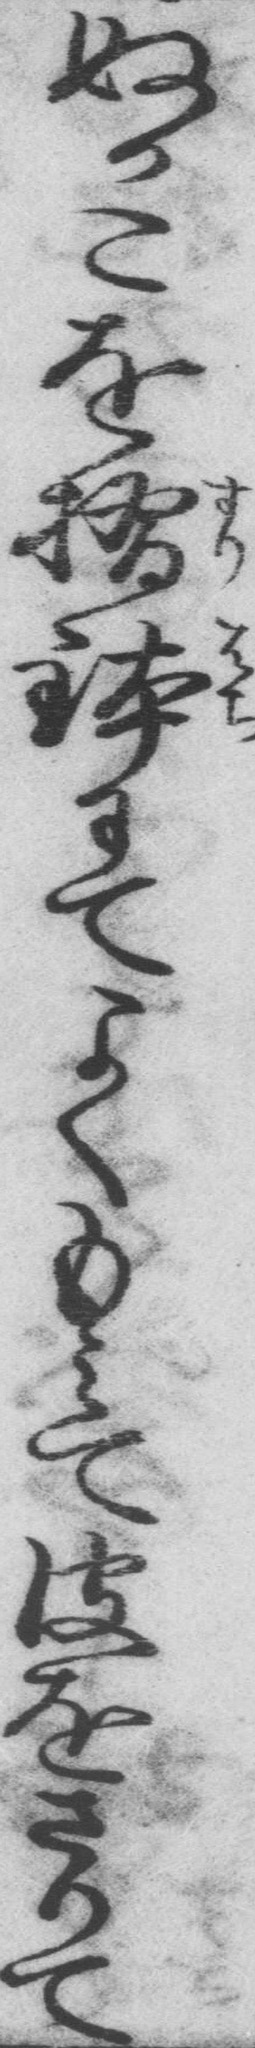ぬかこを摺鉢尓てよくもみて皮をさりて
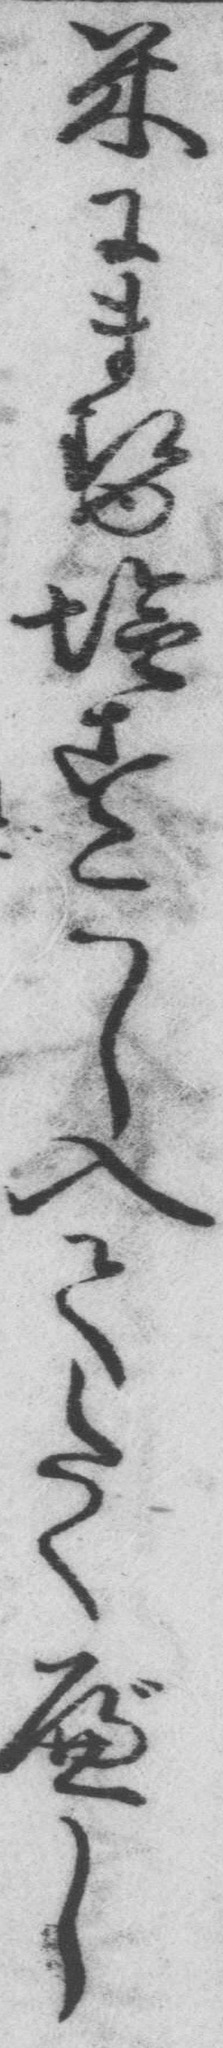米尓ま勢塩春こし入てたくべし
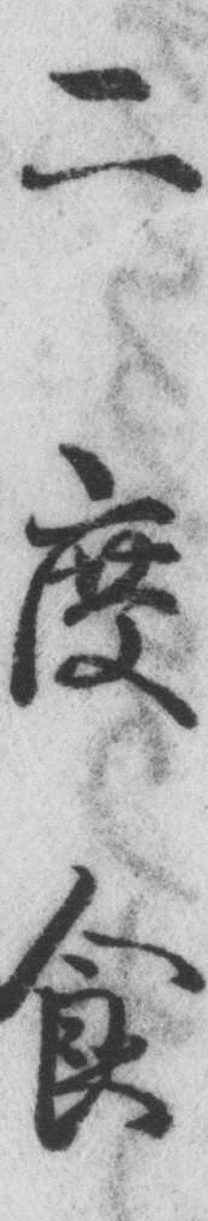二度食
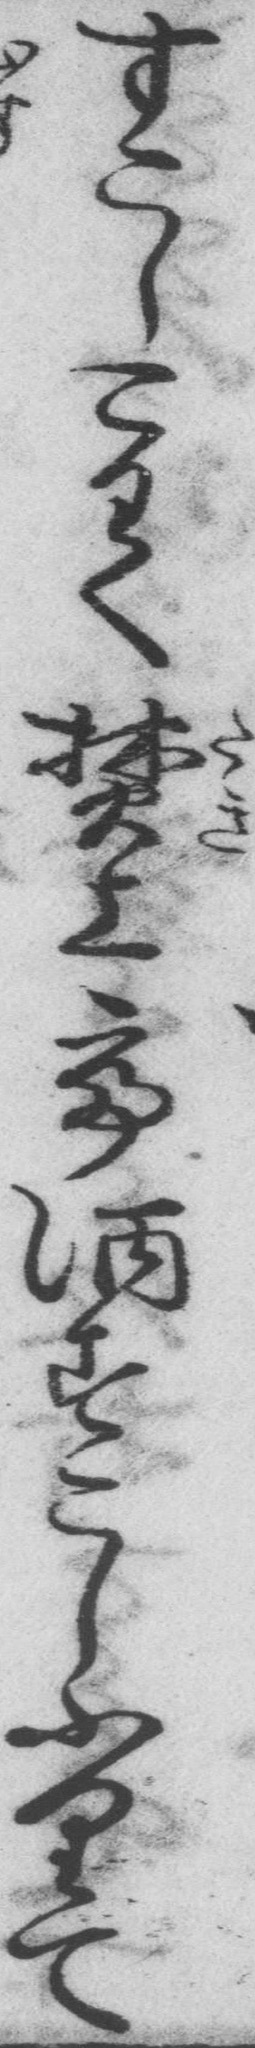すこしこわく焚上亭酒を春こしふ里て
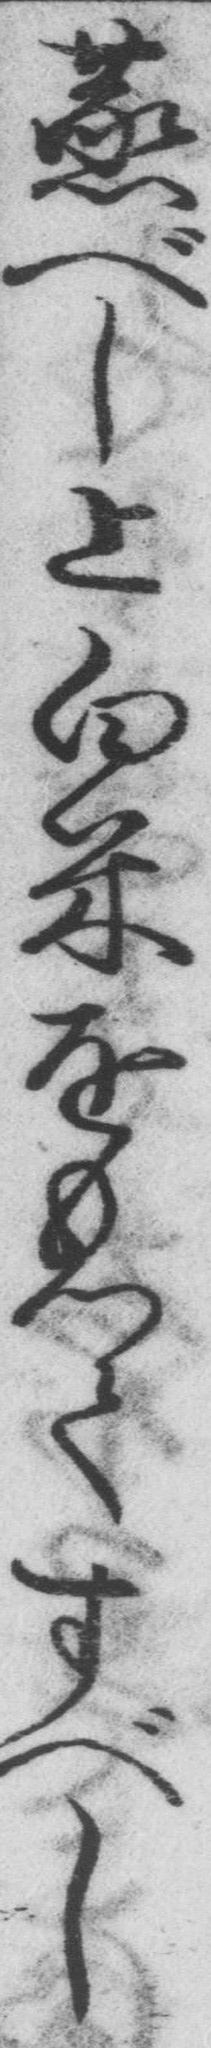蒸べし上白米をもつてすべし
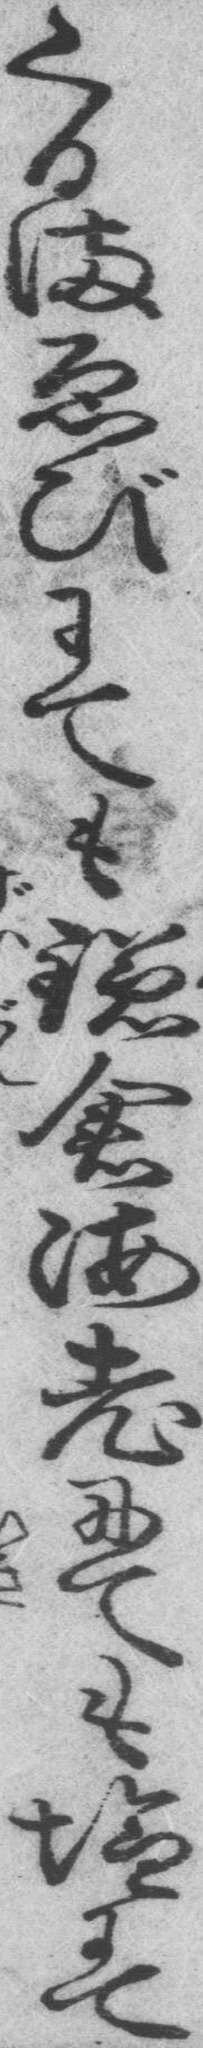くる満ゑび尓ても鎌倉海老丹ても塩尓て
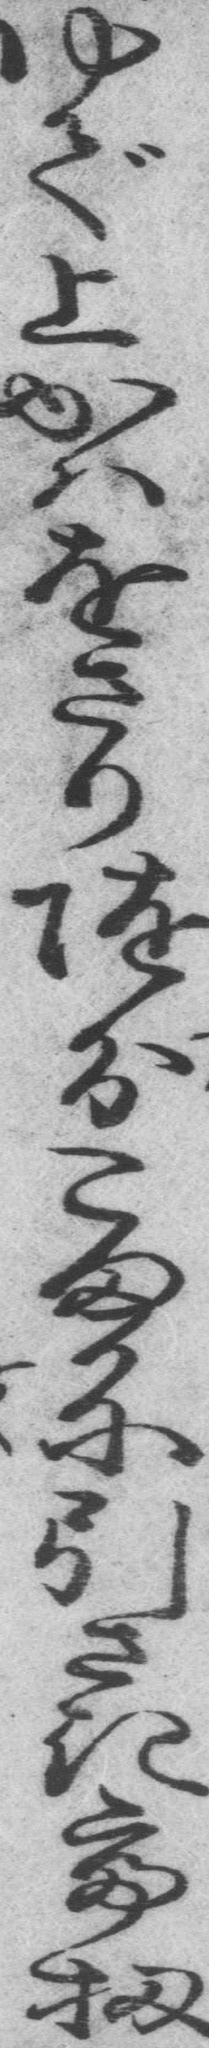ゆで上かはをさり随分こまか尓引さ起亭扨
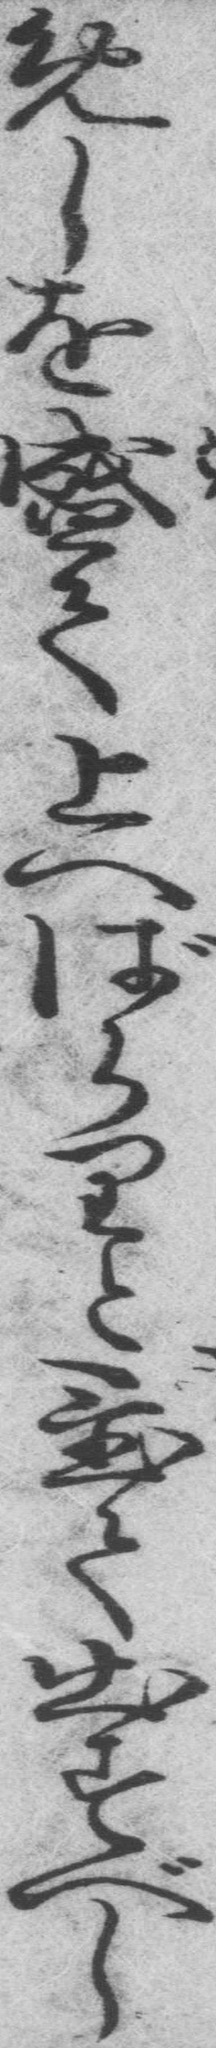免しを盛て上へばら里と置て出春べし
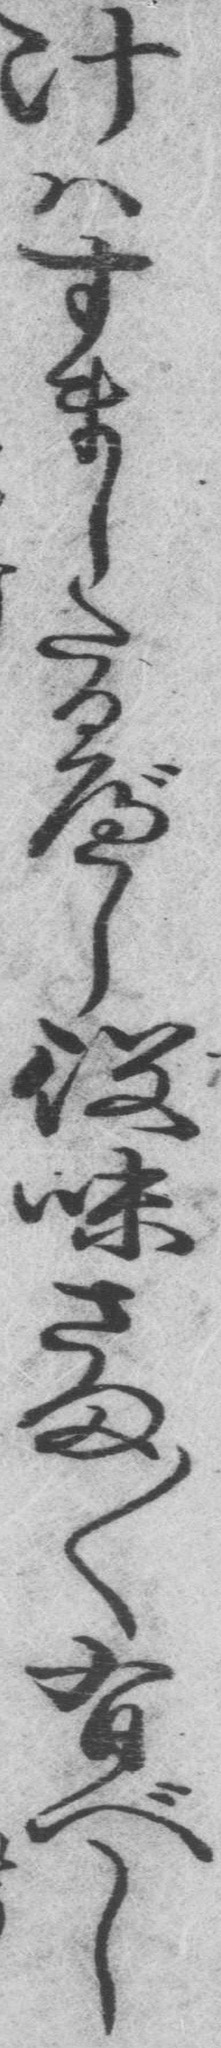汁はすましたるべし役味さま〳〵有べし
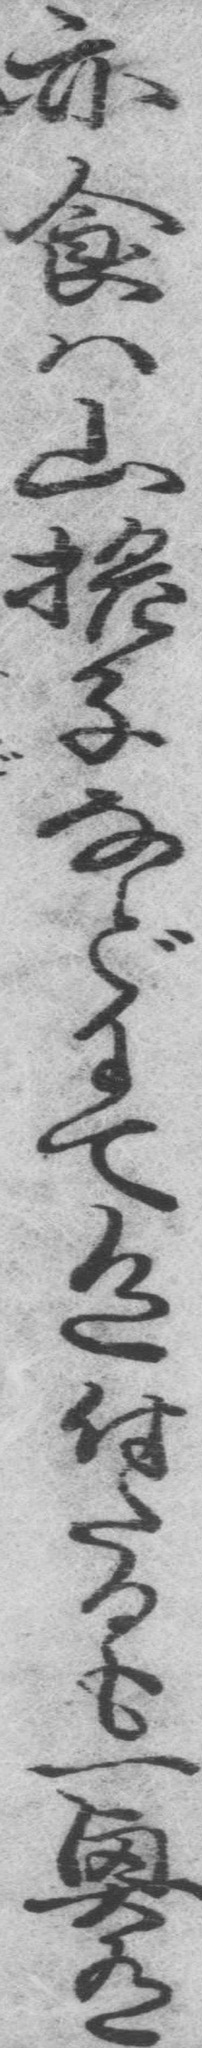亦食は山梔子など尓て色付たるも一興有
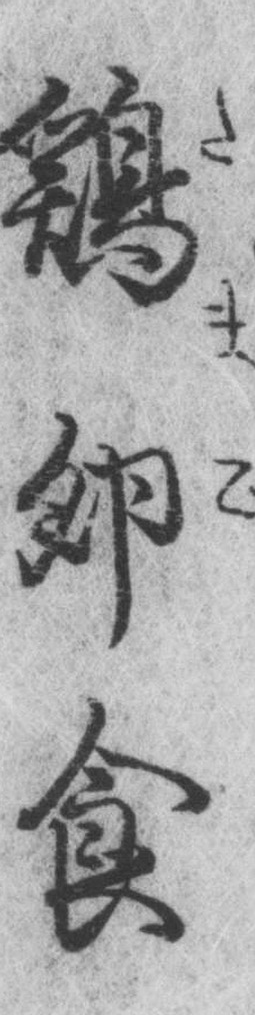鶏夘食
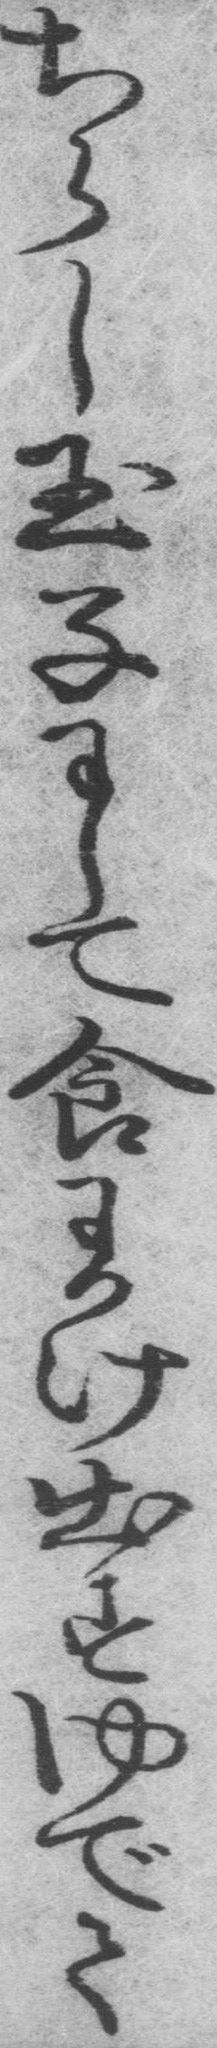ちらし玉子尓して食尓かけ出春ゆでて
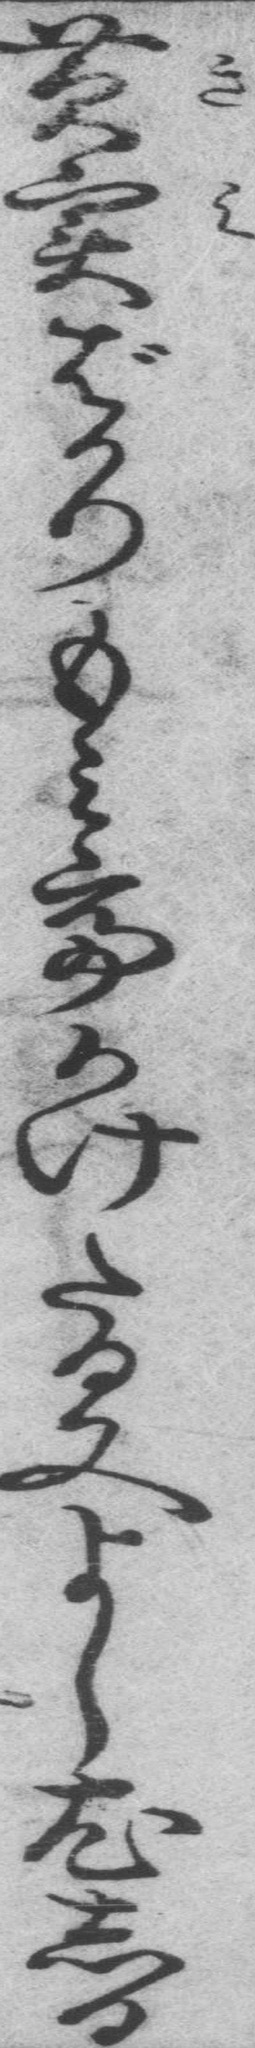黄実ばかりもみ亭かけたる又よし尤志る

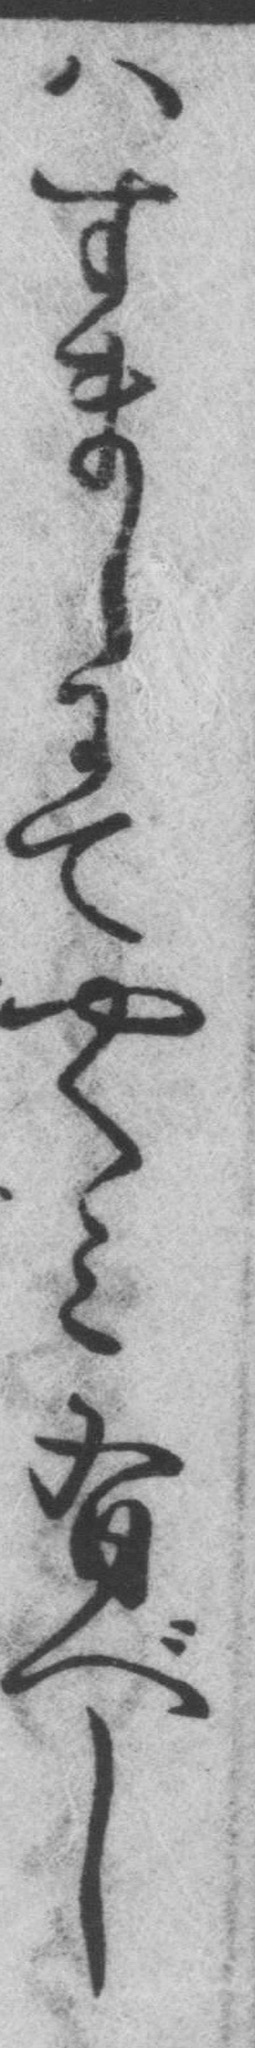はすまし尓てやくみ有べし
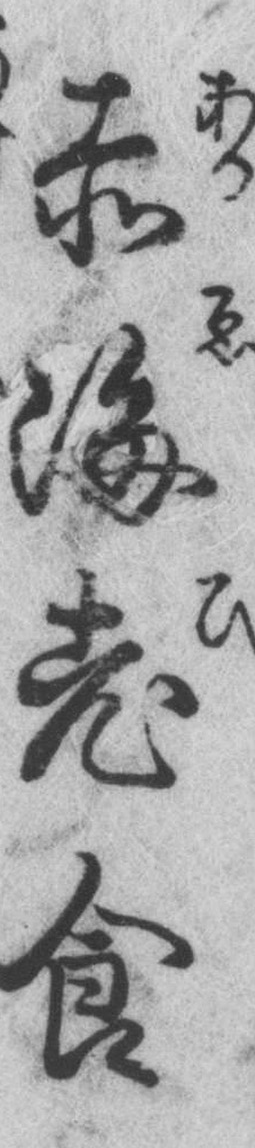赤海老食
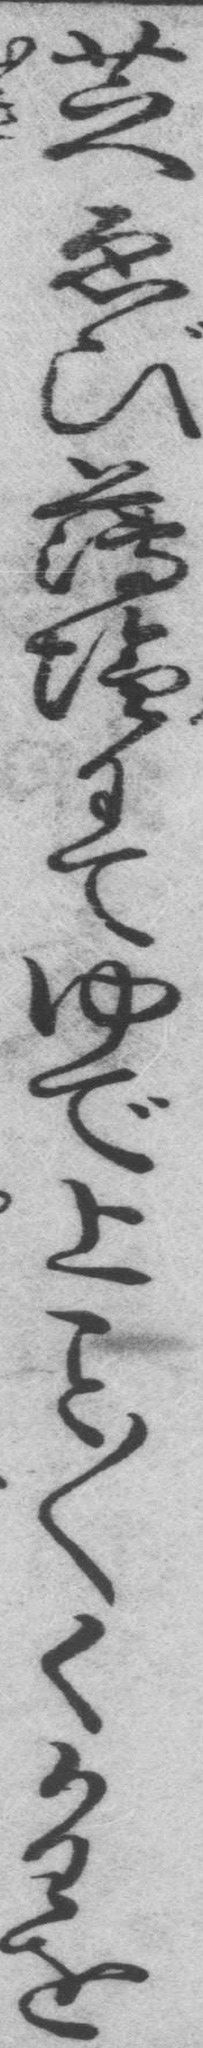芝ゑび薄塩尓てゆで上こと〳〵〳〵かわを
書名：料理伊呂波庖丁
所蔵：大阪府立大学学術情報センター 国文学研究資料館
